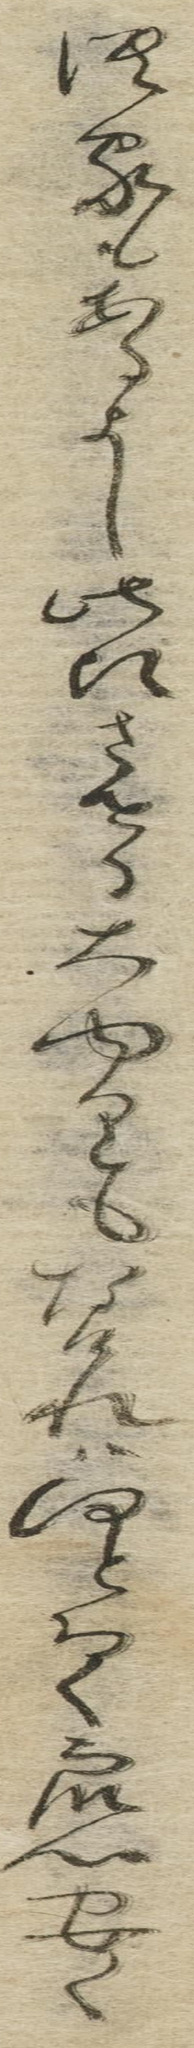潰家もあるよし此頃さをり大ゆりもなけれハ何となく衆心安く

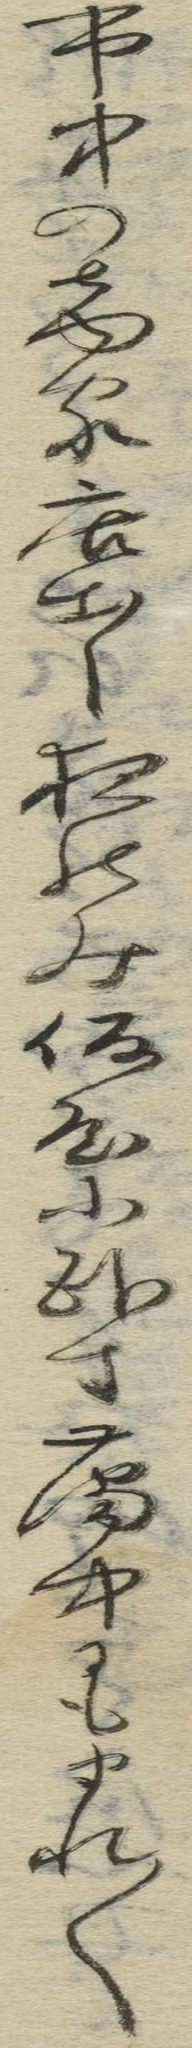市中の商家店出し夜のみ仮屋に臥す藩中にもまれ〳〵
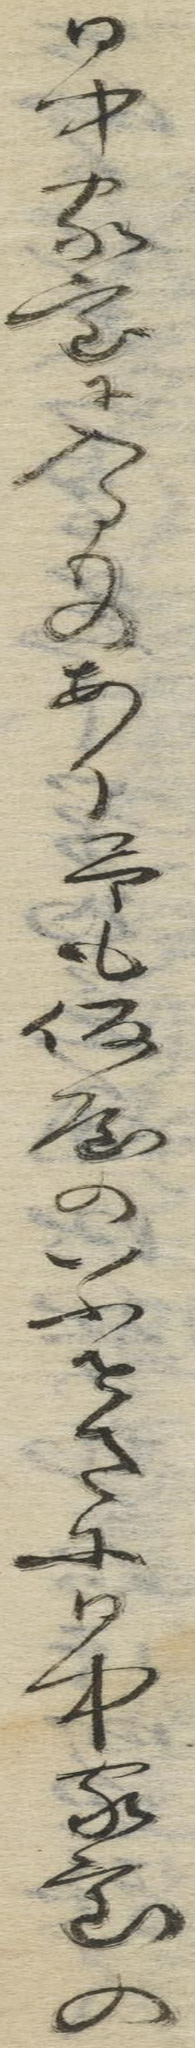日中家室に入るものあり予も仮屋のいつをさに日中家室の
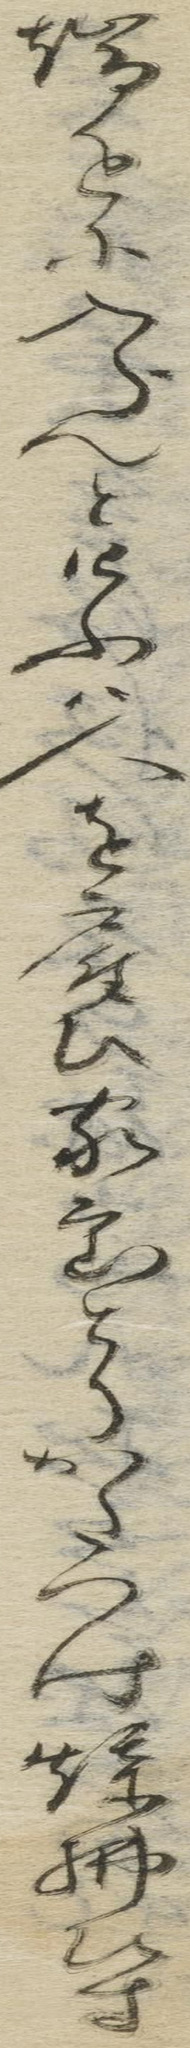端近に入るらんとけふハ人を雇ひ家室とりかたつけ煤払ひす
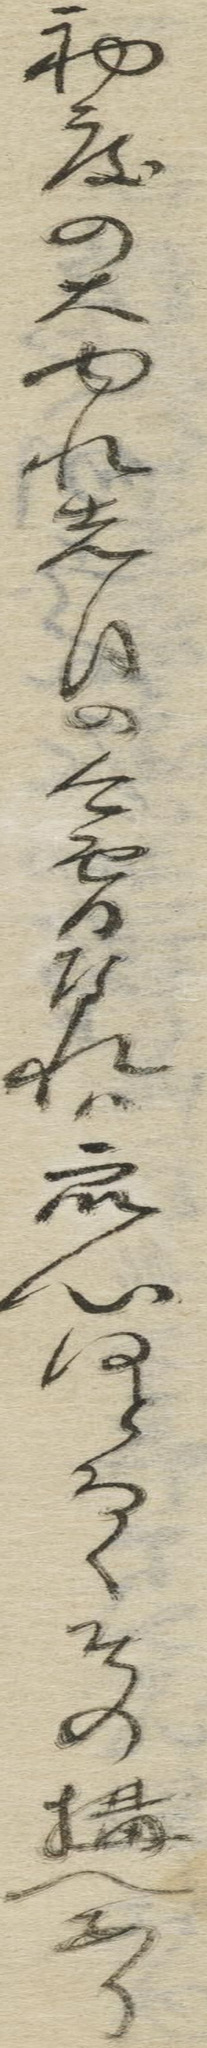初度の大ゆれ先月の今宵なれハ衆心ほとなくその構へあり
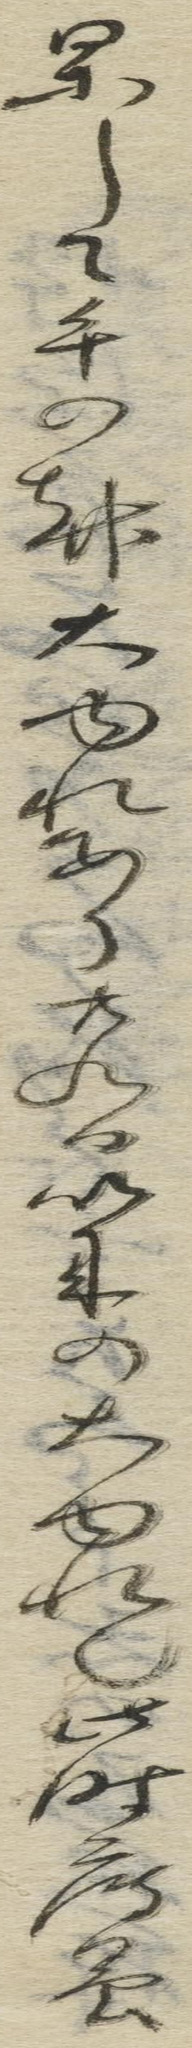果して午の刻大ゆれあり廿九日以来のおおゆれ也此時薄曇
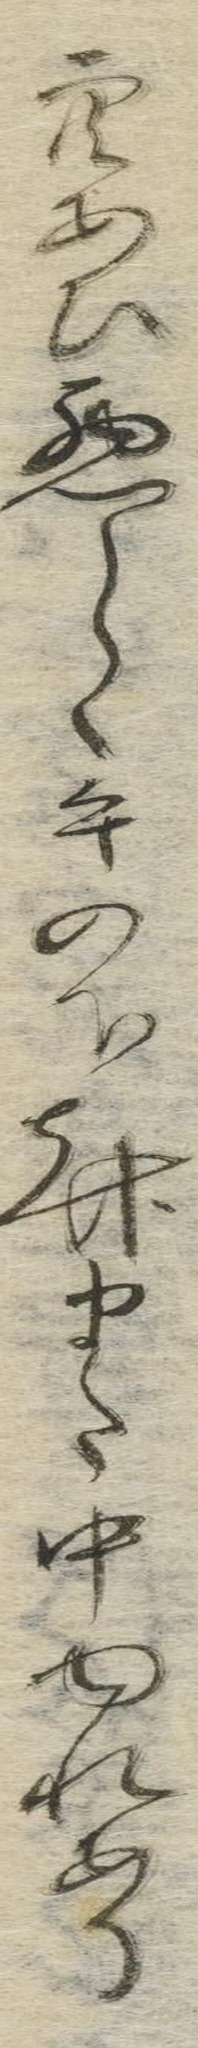空あひ悪しく午の下刻また中ゆれあり
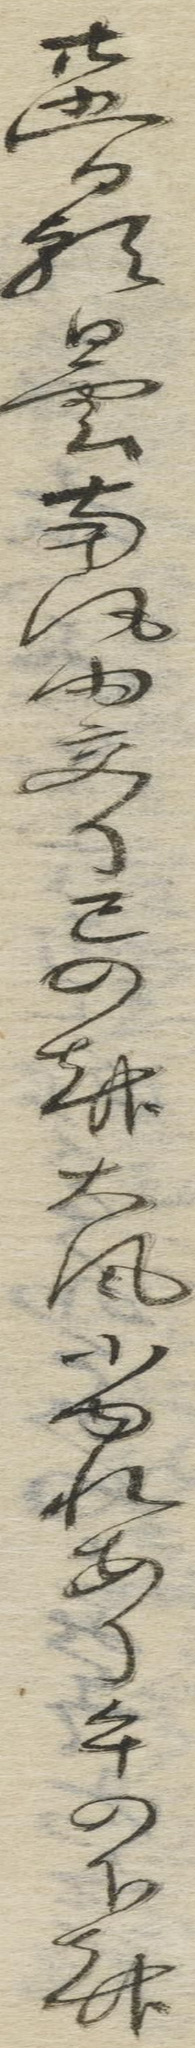廿五日朝曇南風雨交り巳の刻大風小ゆれあり午の下刻
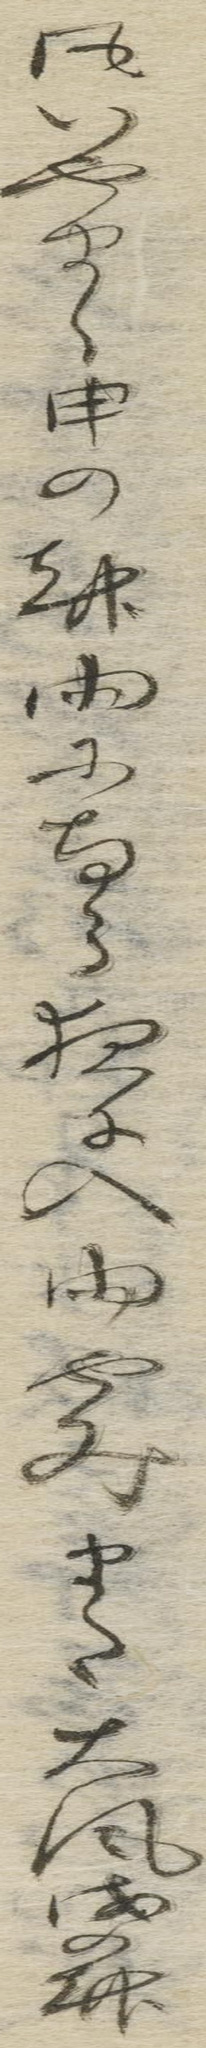風いやまし申の刻雨になる夜に入雨やみまた大風戌の刻
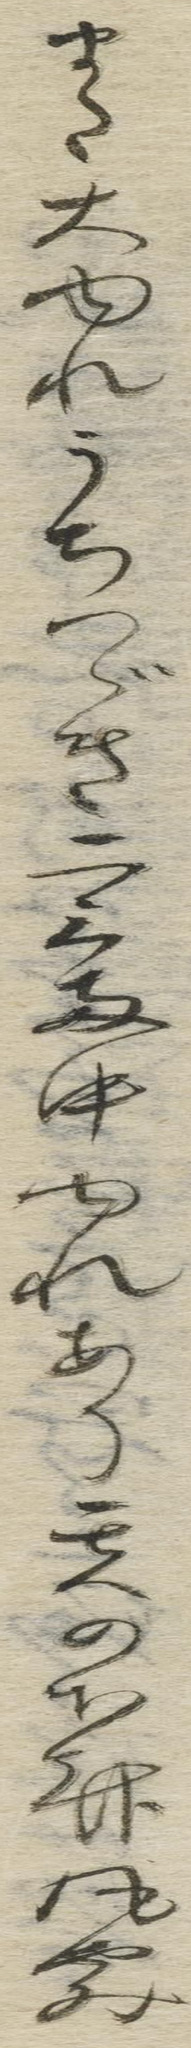また大ゆれうちつゞき二三両中ゆれあり亥の下刻風やみ
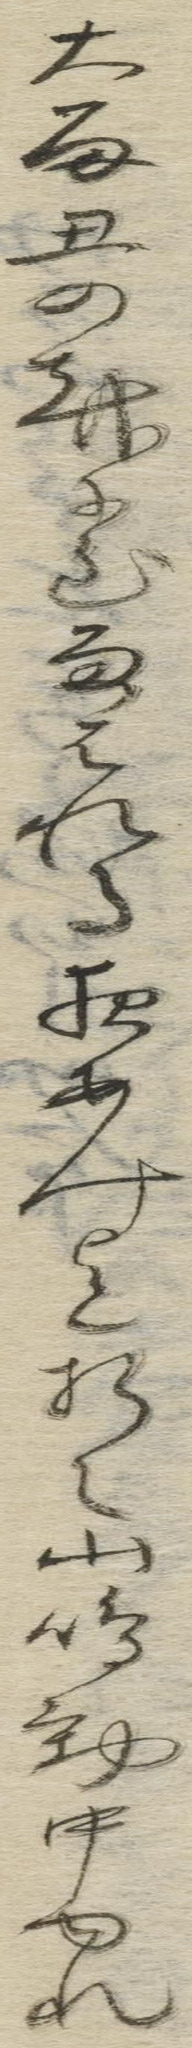大雨丑の刻に至雨はれる夜あけ迄折々山鳴動中ゆれ
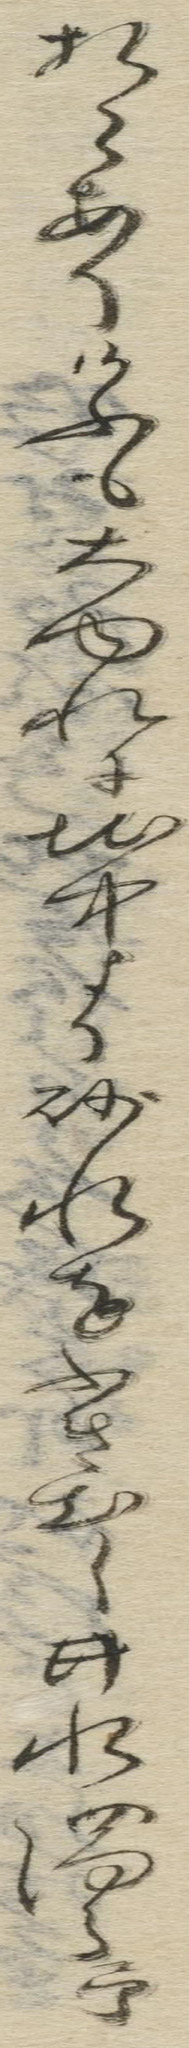折々ありけふも大ゆれに地中より砂水をふき出し井水濁る予
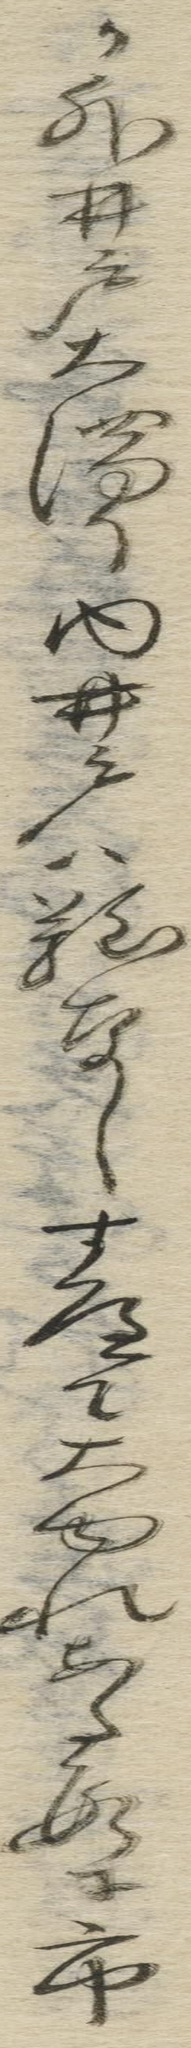か外井戸大濁り内井戸ハ難なしすへて大ゆれある如に市
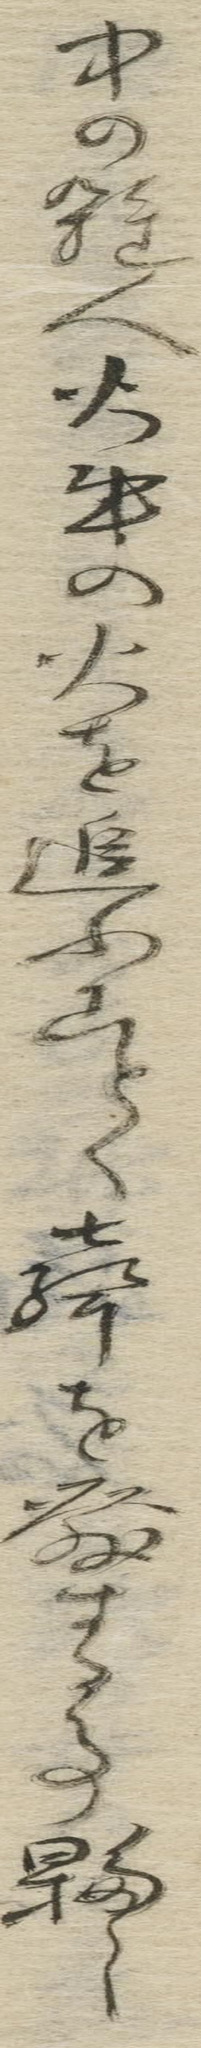中の雑人火牛の火を追ふことく聲を發する事夥し
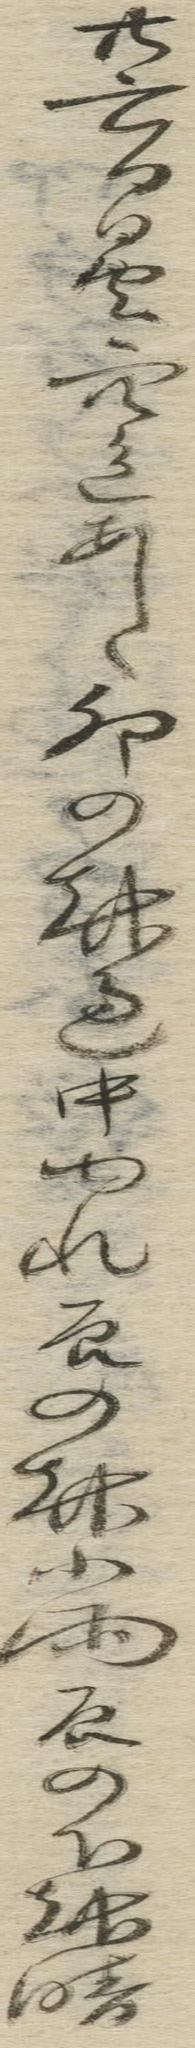廿六日曇空色あしく卯の刻過中ゆれ辰の刻小雨辰下刻晴
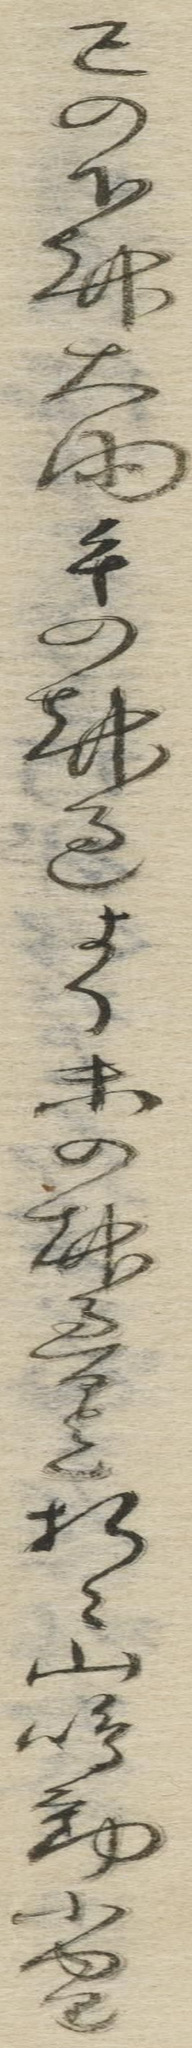巳の下刻大雨午の刻過より未の刻過る迄折々山鳴動小ゆり
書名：弘化丁未天變日記
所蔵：東京大学地震研究所図書室 Earthquake Research Institute Library, The University of Tokyo, JAPAN
